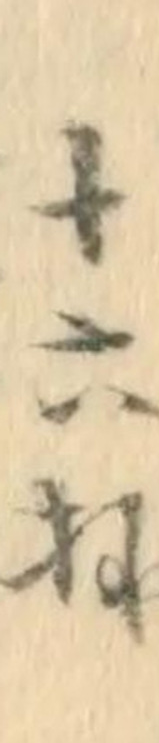十六杯
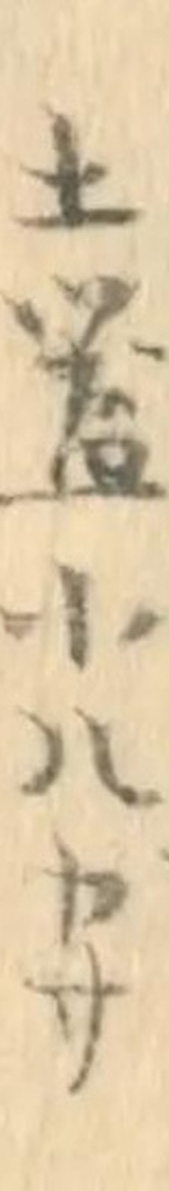土器小ハカサ

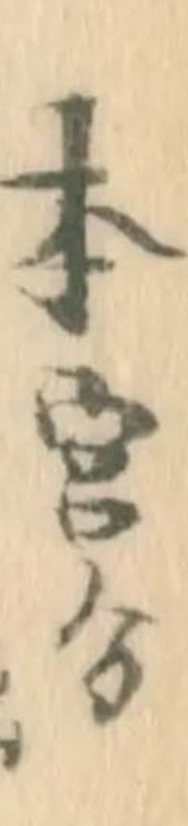本宮分
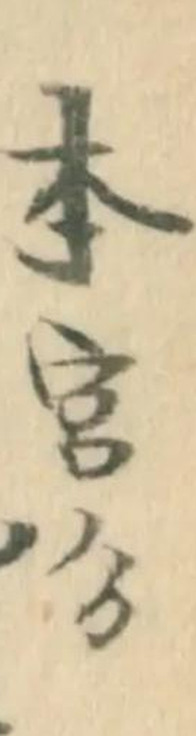本宮分
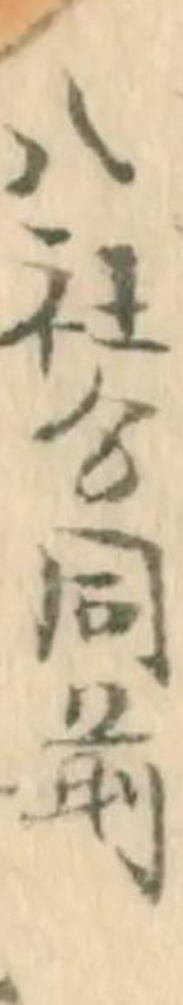八社分同前
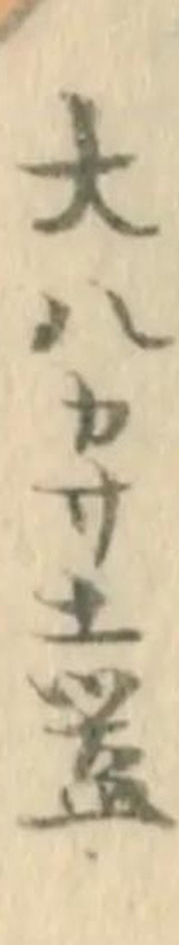大ハカサ土器
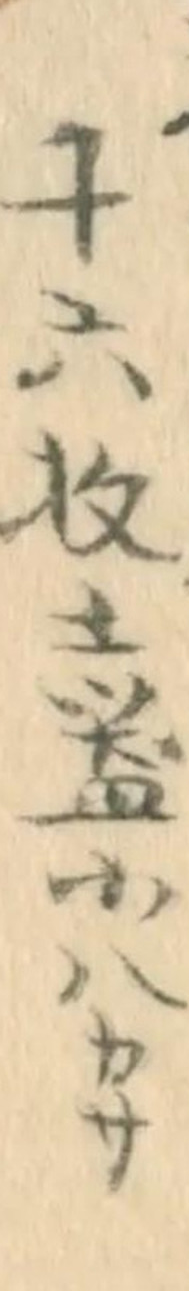十六枚土器小ハカサ
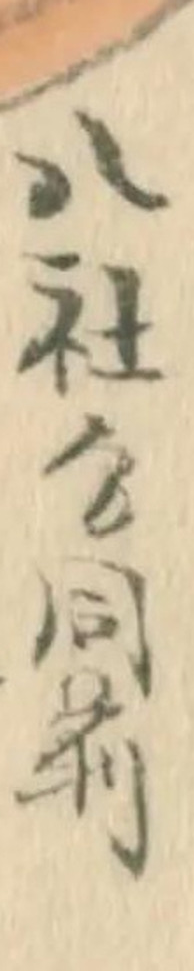八社分同前
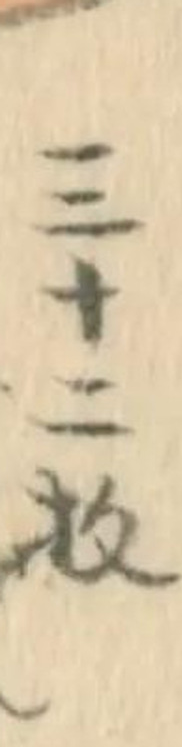三十二枚
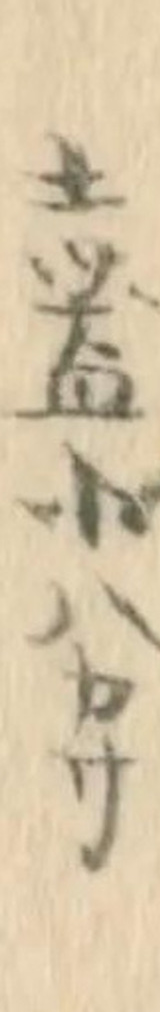土器小ハカサ
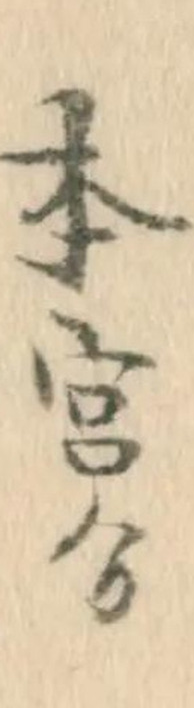本宮分
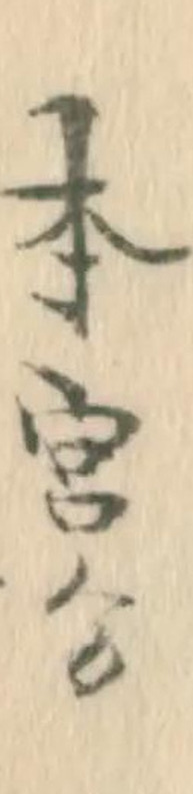本宮分
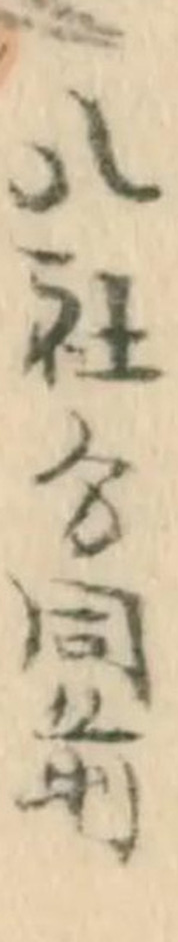八社分同前
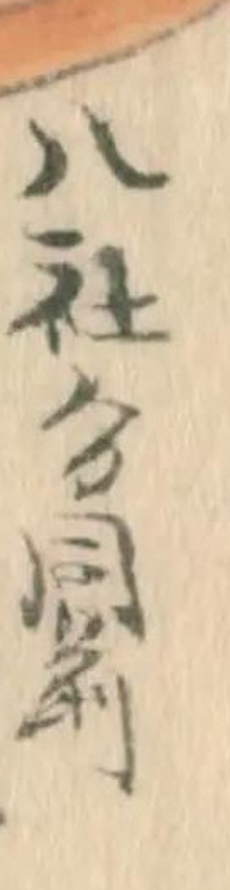八社分同前
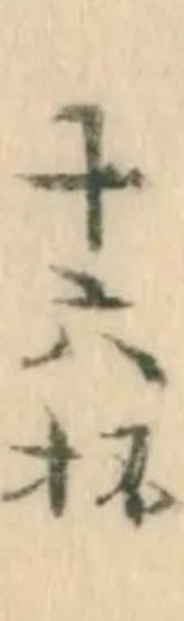十六杯
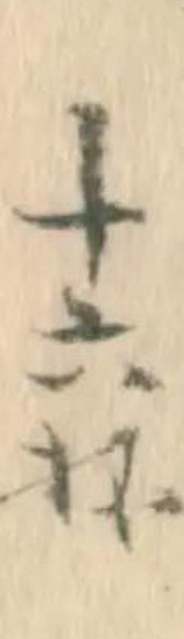十六杯
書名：葵御祭供進之神饌諸品色目書
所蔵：国立国会図書館 National Diet Library, JAPAN
